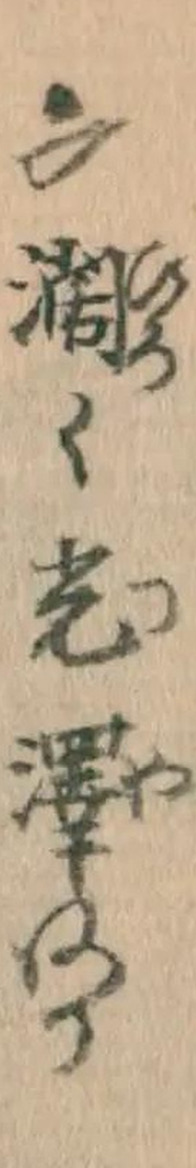●○闊く光沢あり
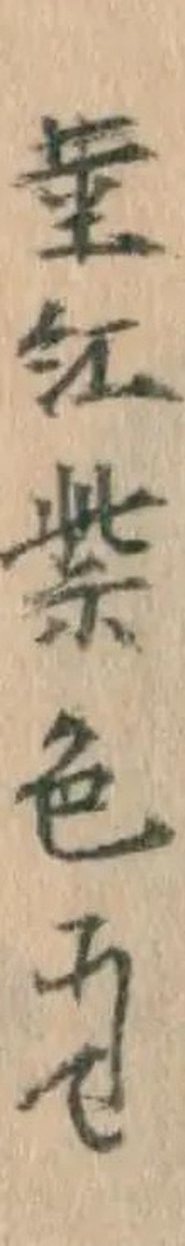茎紅紫色にして
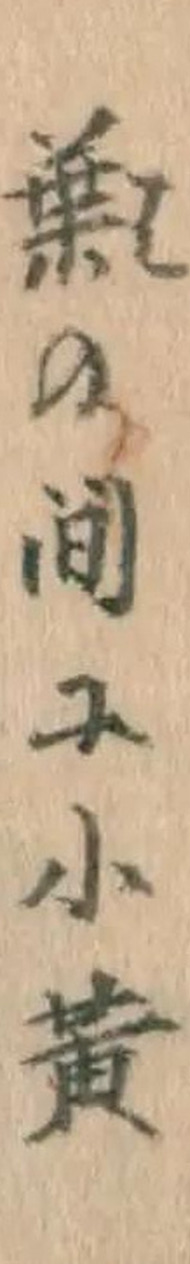葉の間に小黄
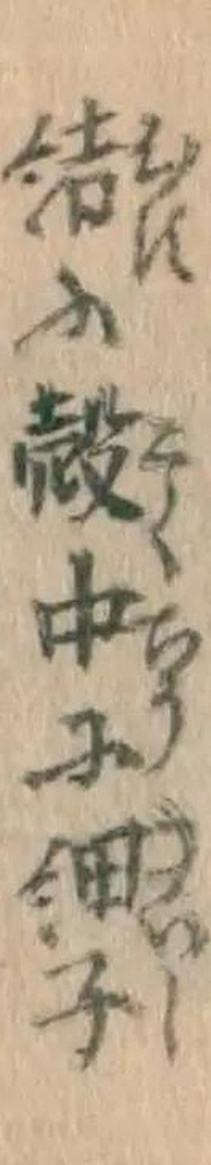結ふ殻中に細子
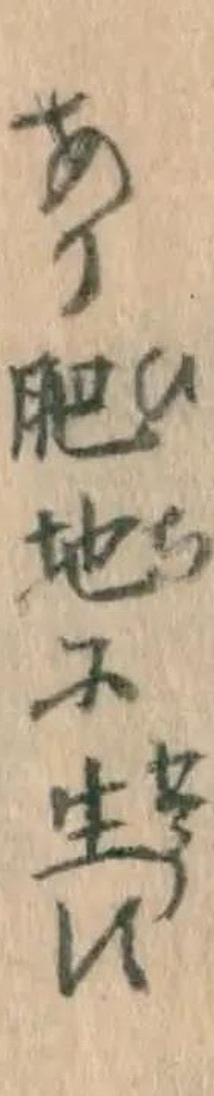あり肥地に生す
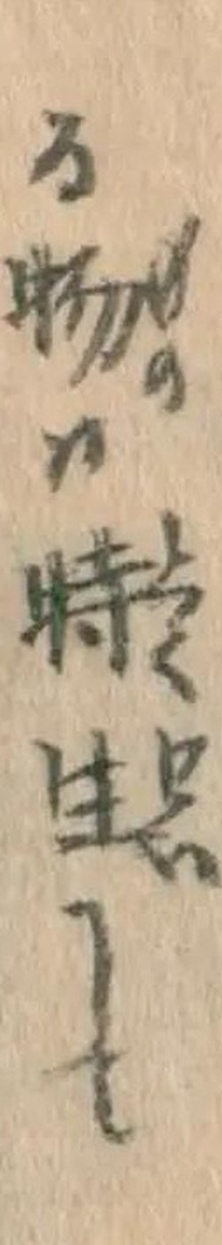る物は特生して
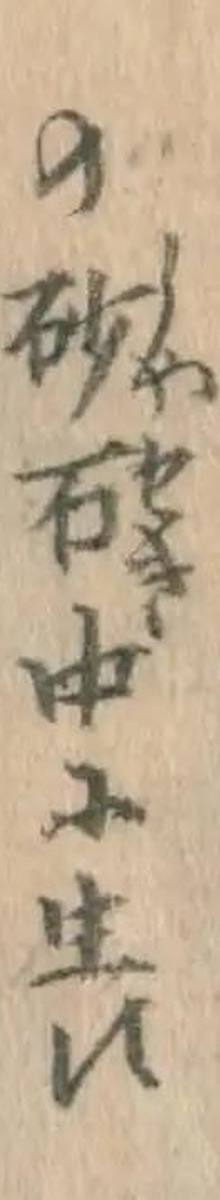の砂石中に生す
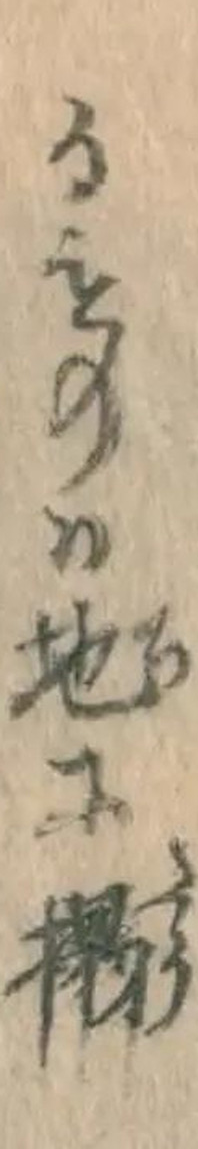るものは地に搨
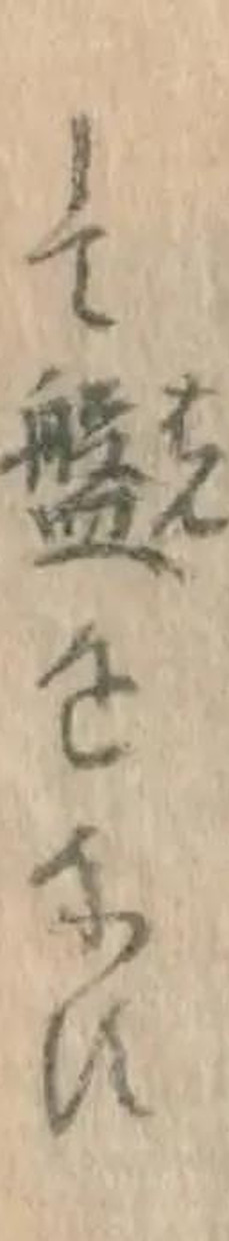して盤をなす
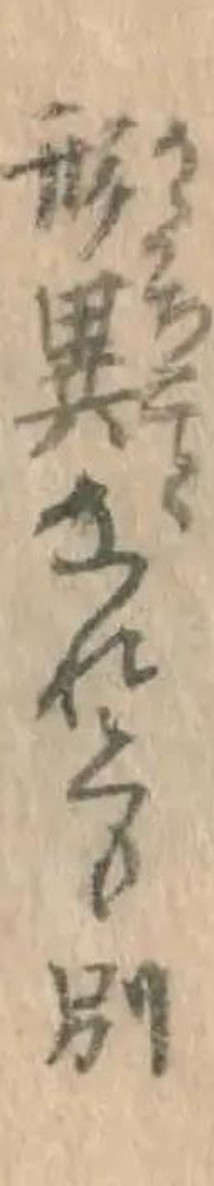形異なれとも別
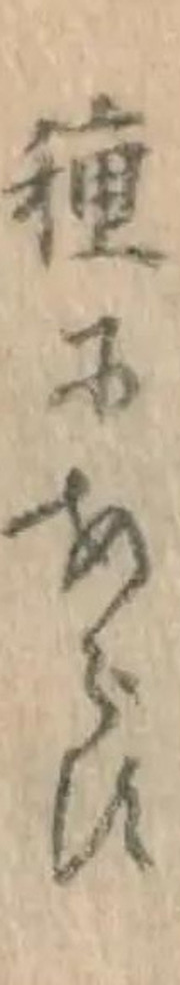種にあらす

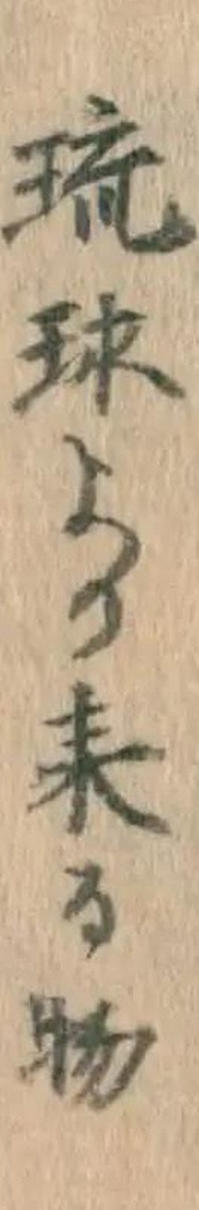琉球より来る物
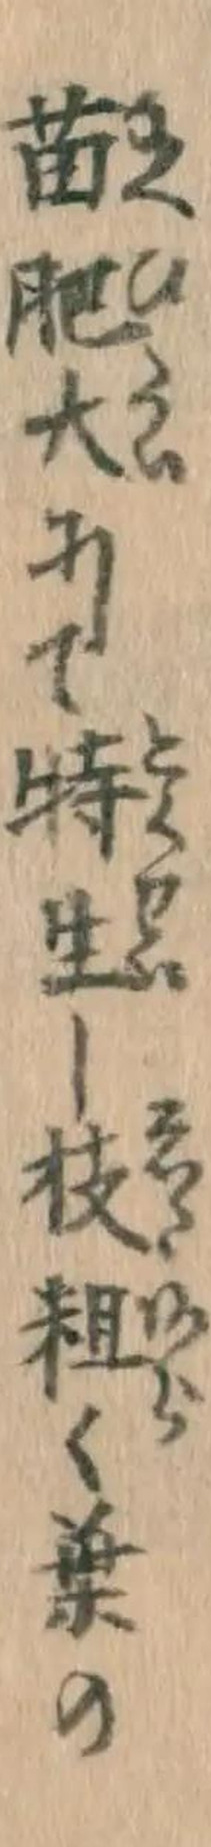苗肥大にして特生し枝粗く葉の
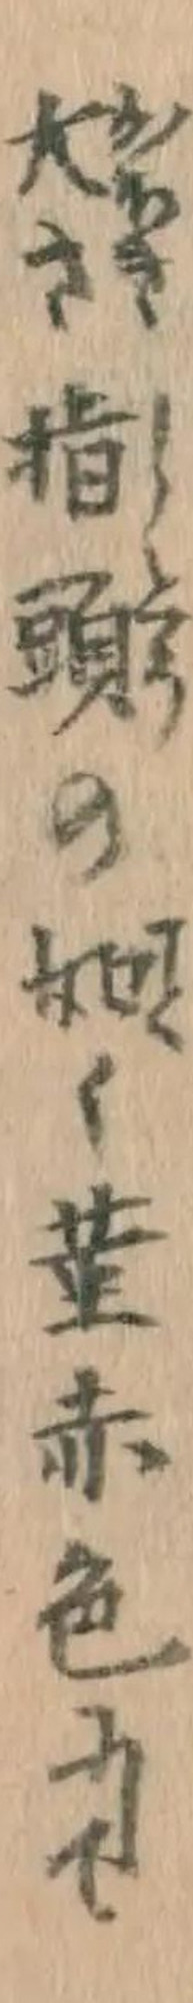大さ指頭の如く茎赤色にして
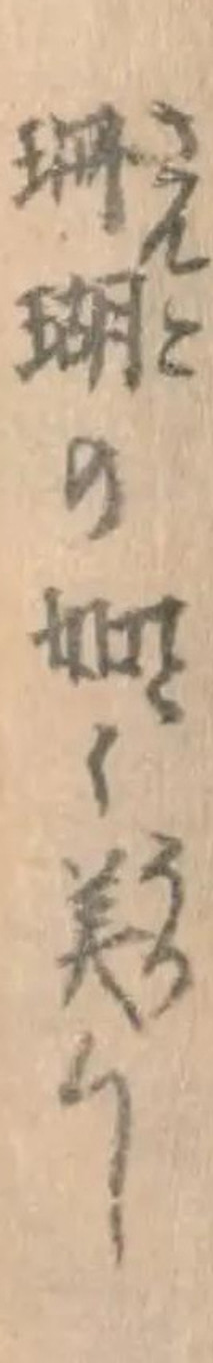珊瑚の如く美くし
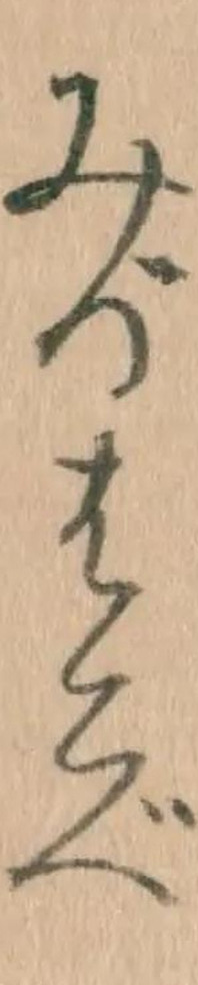みづはこべ
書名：本草図譜. 巻46-48
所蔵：国立国会図書館 National Diet Library, JAPAN
